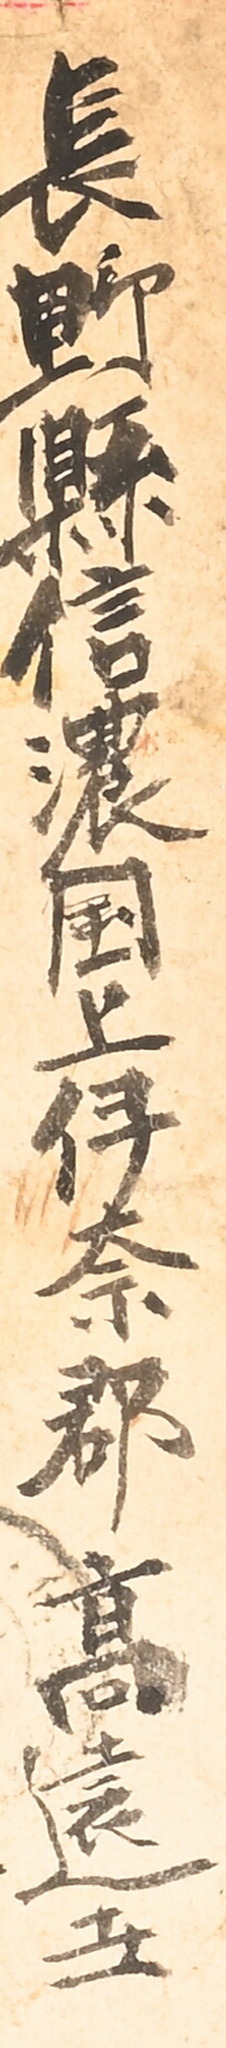「長野県信濃国上伊奈郡高遠在

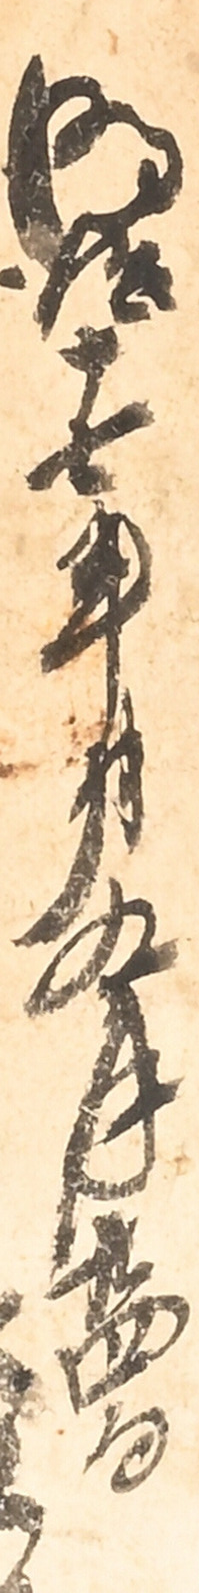明治十七年第九月廿四日
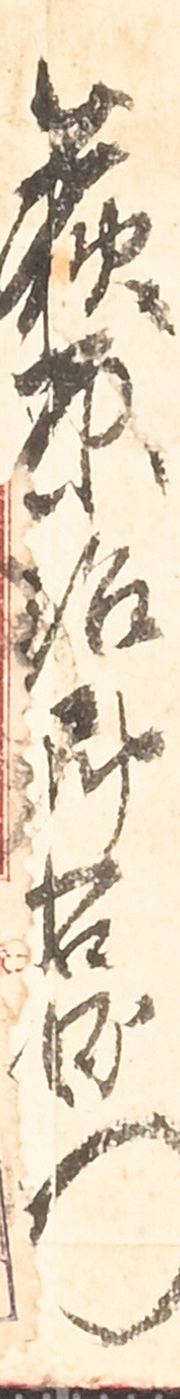荻原治郎右衛門
